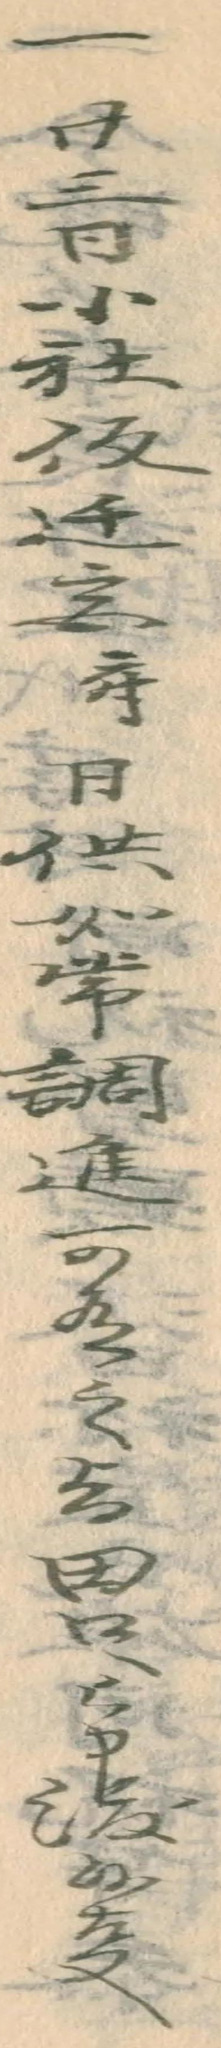一廿三日小社仮迁宮ニ付日供如常調進可有之旨田口へ被申渡候事
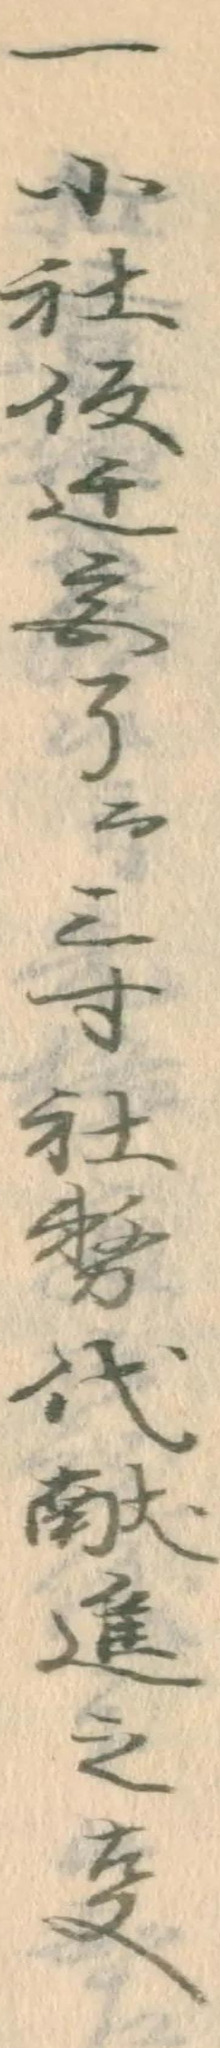一小社仮迁宮了而三寸社務代献進之事
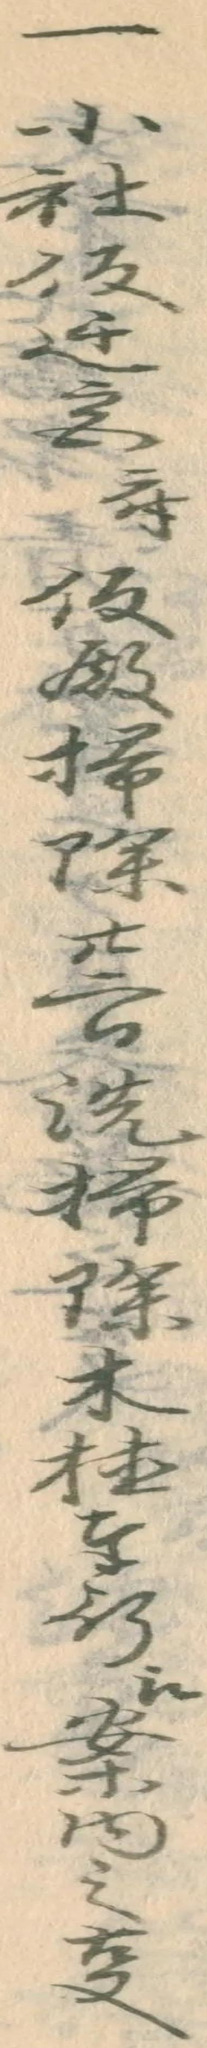一小社仮迁宮ニ付仮殿掃除廿二日洗掃除木植奉行江案内之事
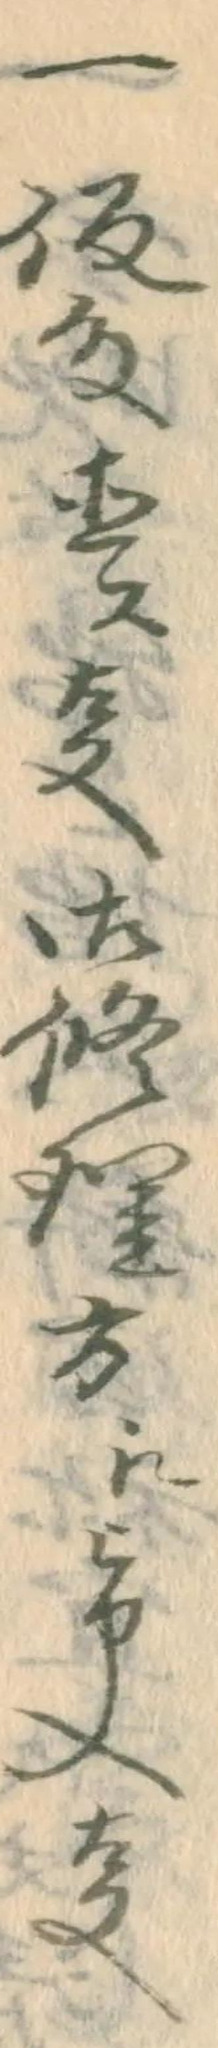一仮殿直ス事御修理方江被申入事
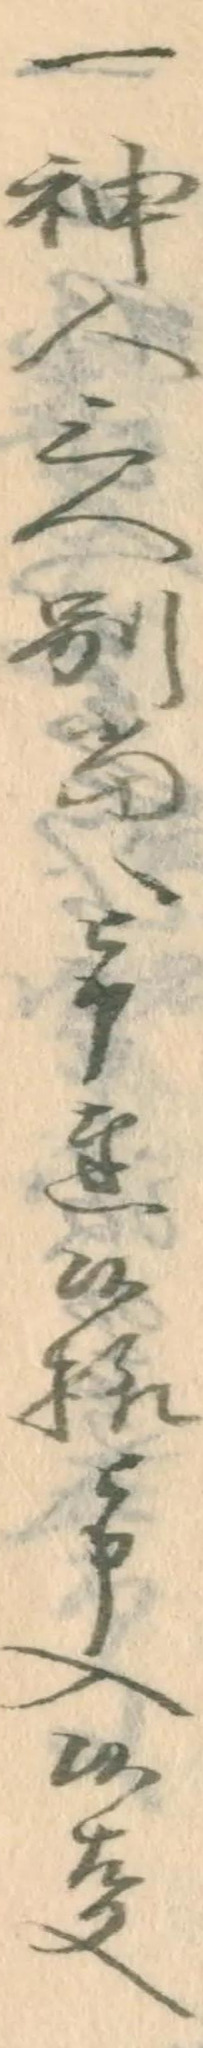一神人三人別当へ被申達候様被申入候事
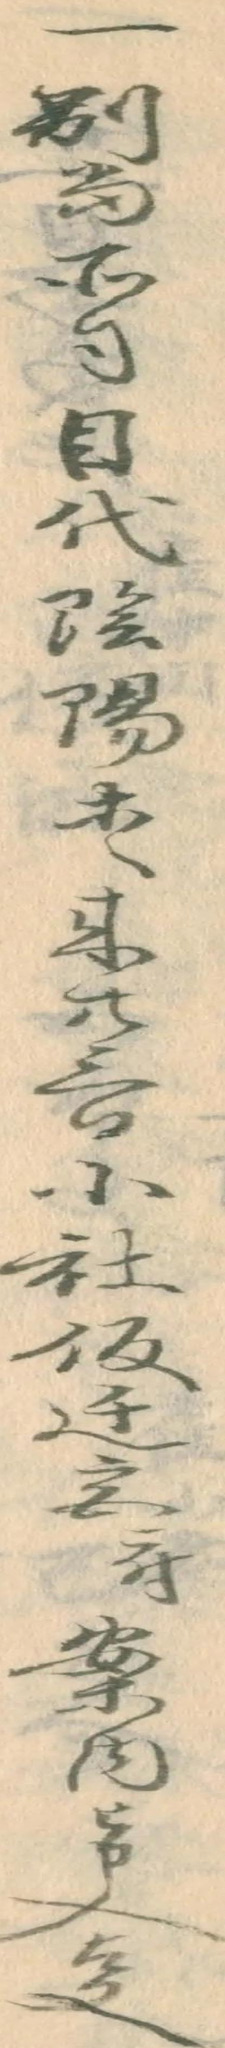一別当所司目代陰陽等へ来廿三日小社仮迁宮ニ付案内被申入候事

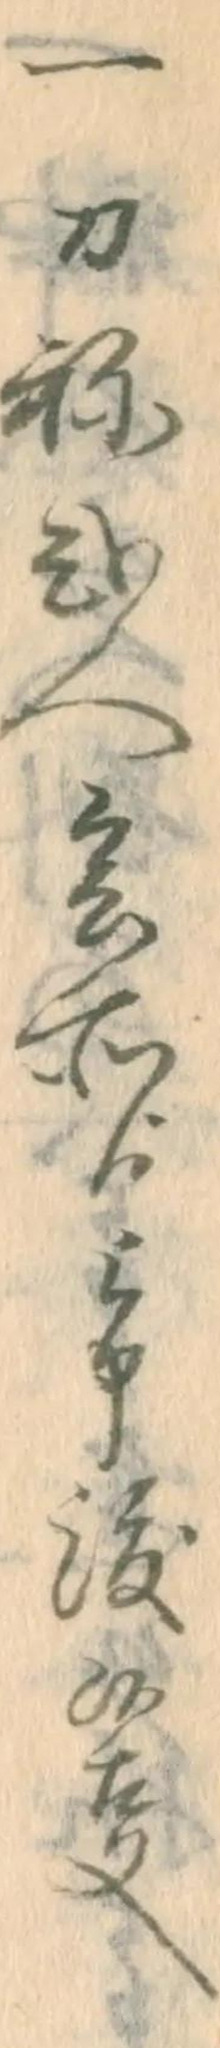一刀祢弐人会所ゟ被申渡候事
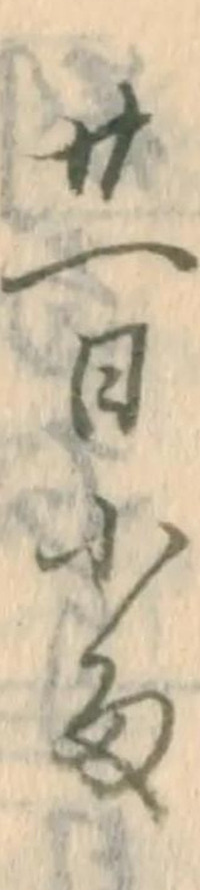廿一日小雨
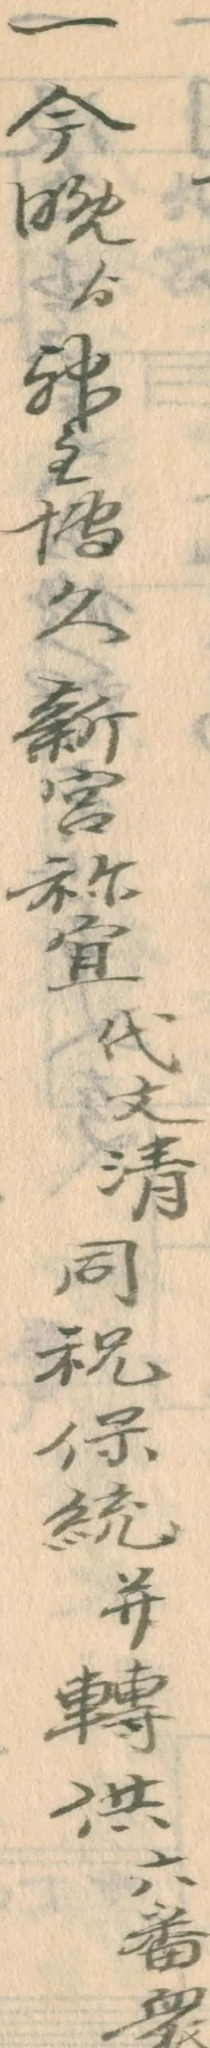一今晩ゟ神主博久新宮祢宜代文清同祝保統并転供六番衆
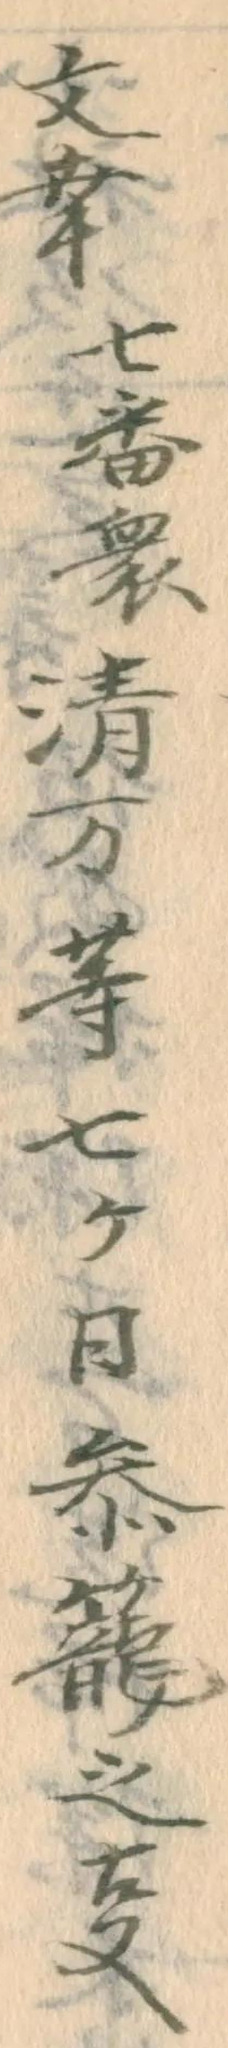文幸七番衆清万等七ヶ日参籠之事
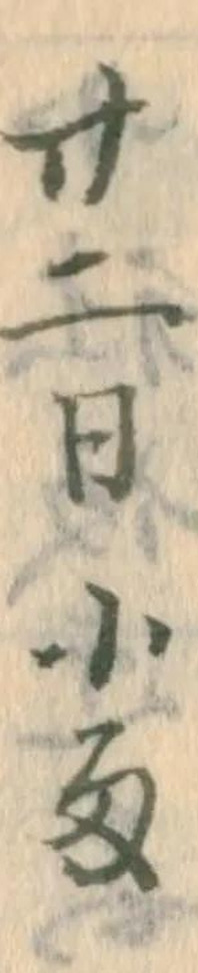廿二日小雨
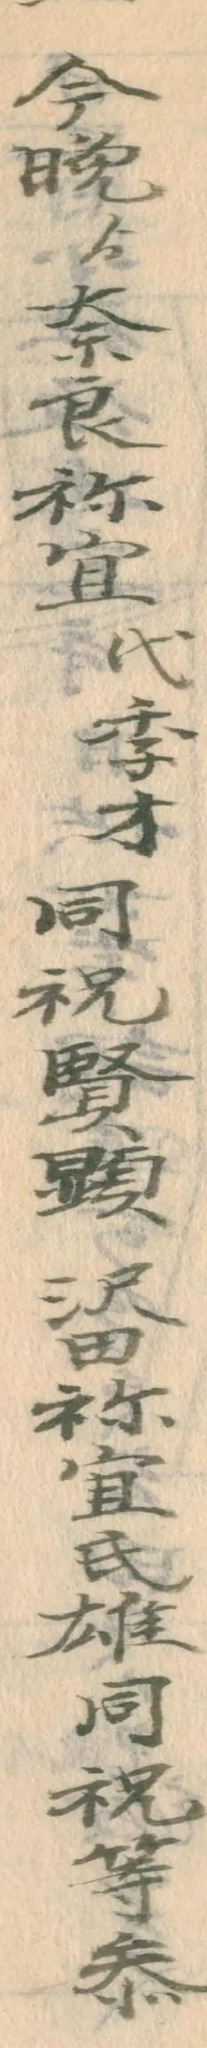一今晩ゟ奈良祢宜代季才同祝賢顕沢田祢宜氏雄同祝等参
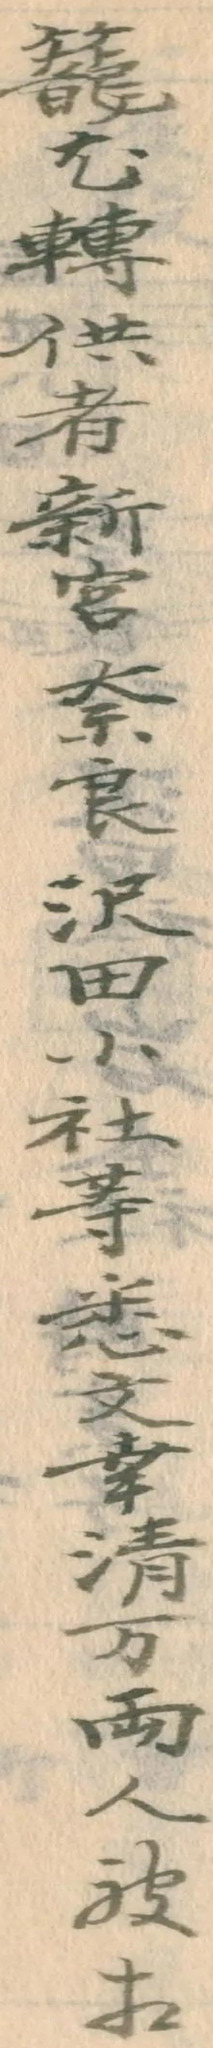籠尤転供は新宮奈良沢田小社等悉文幸清万両人被相
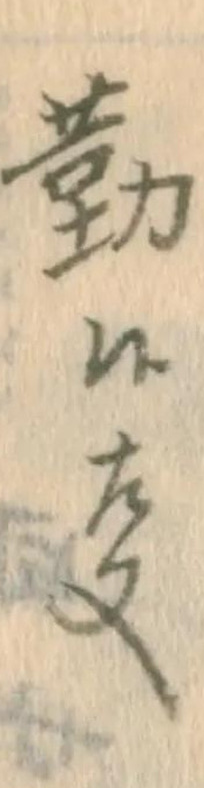勤候事
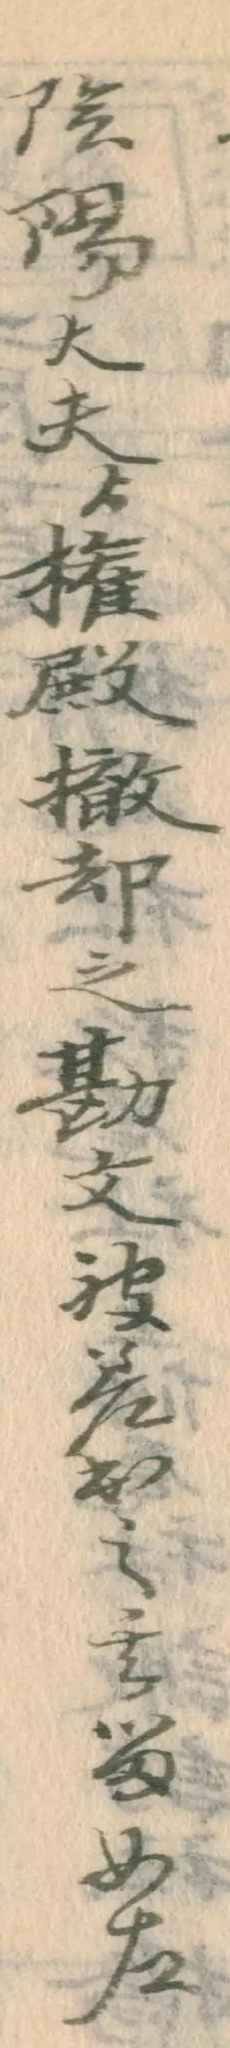一陰陽大夫ゟ権殿撤却之勘文被差出之其留如左
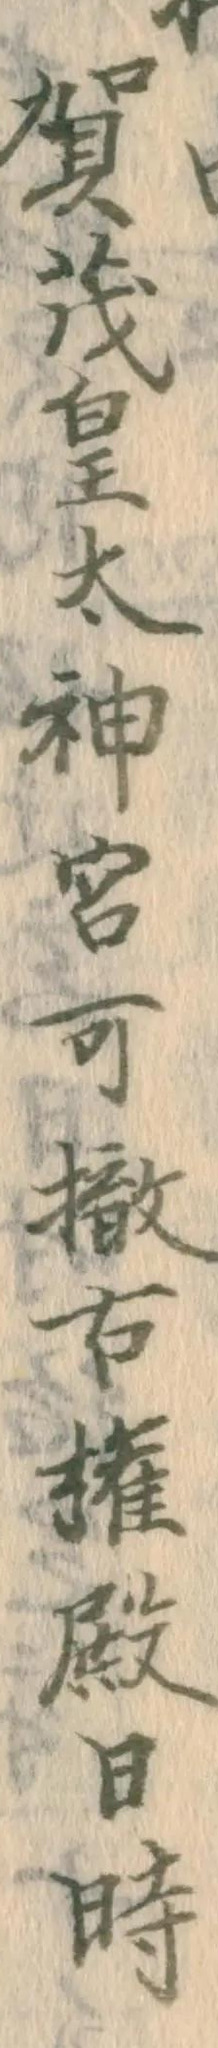賀茂皇太神宮可撤古権殿日時
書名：賀茂社記録. 第17冊
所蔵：国立国会図書館 National Diet Library, JAPAN
